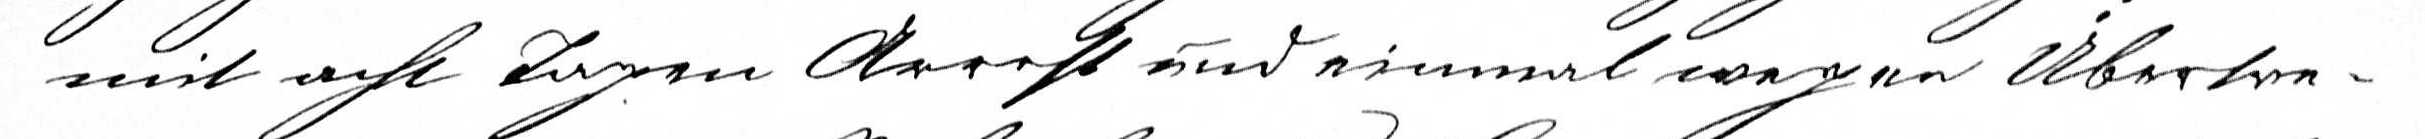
mit acht Tagen Arrest und einmal wegen Übertre¬
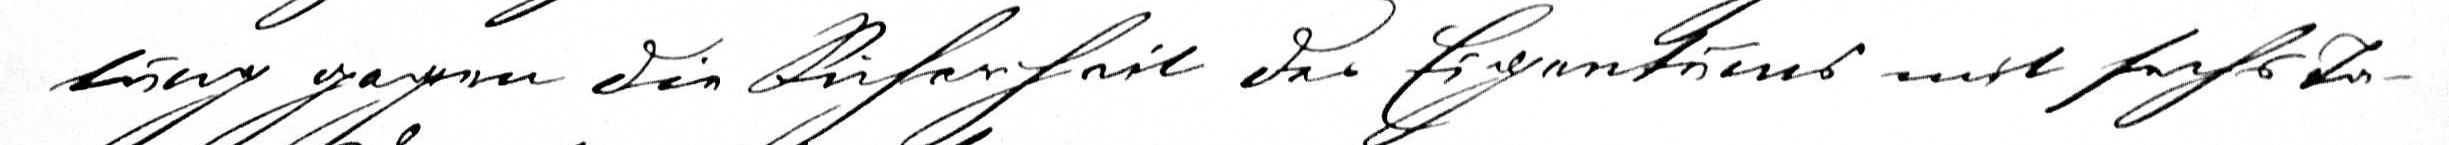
tung gegen die Sicherheit des Eigentums mit sechs Ta¬
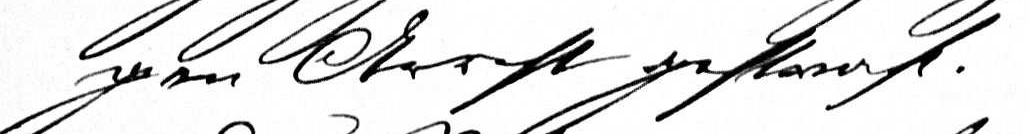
gen Arrest gestraft.
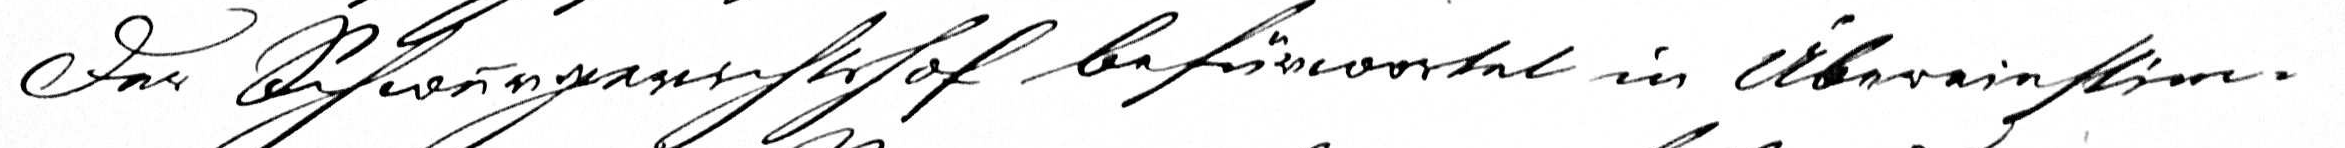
Der Schwurgerichtshof befürwortet in Übereinstim¬
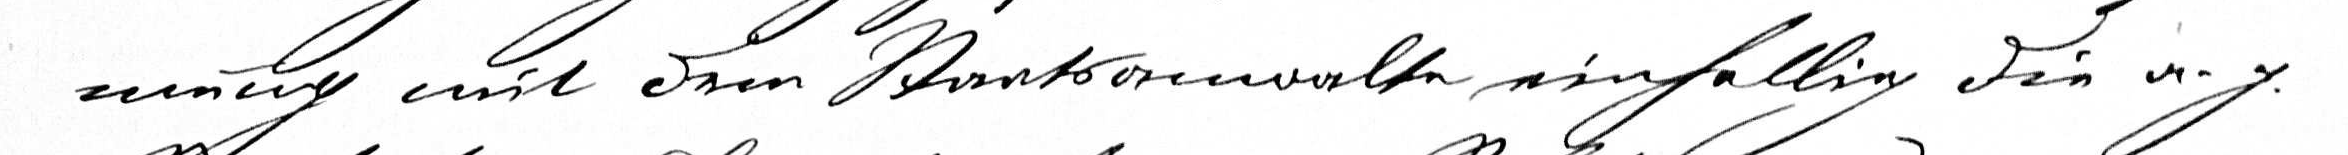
mung mit dem Staatsanwalt einhellig die a.g.
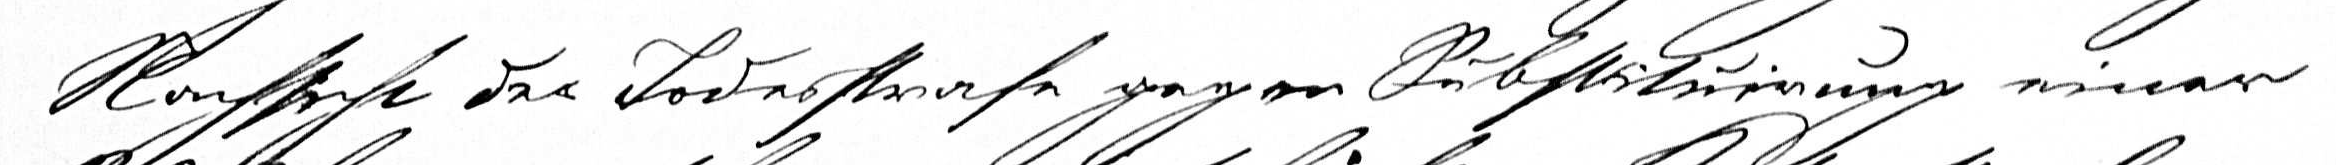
Nachsicht der Todesstrafe gegen Substituirung einer
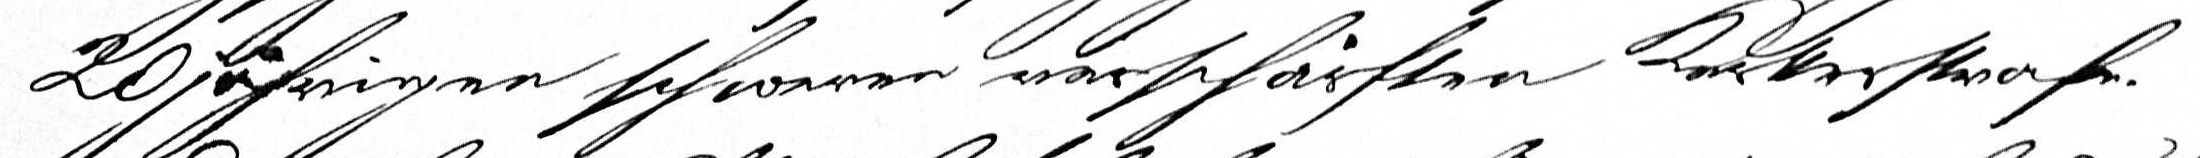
20jährigen schweren verschärften Kerkerstrafe.
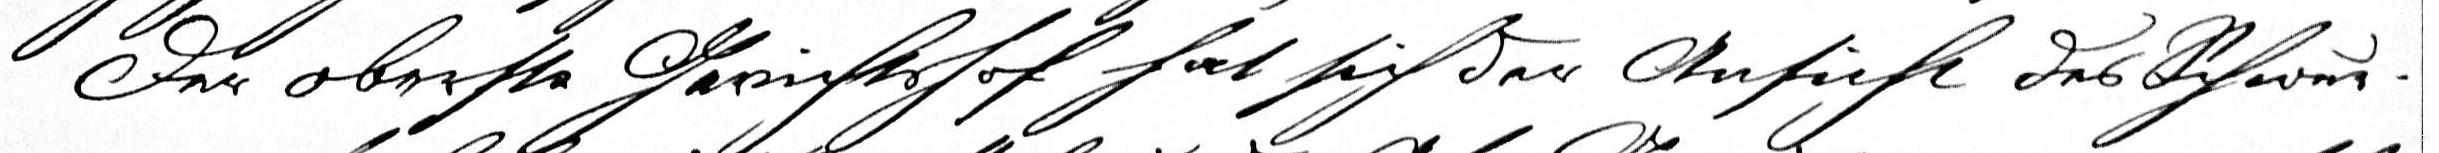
Der oberste Gerichtshof hat sich der Ansicht des Schwur¬
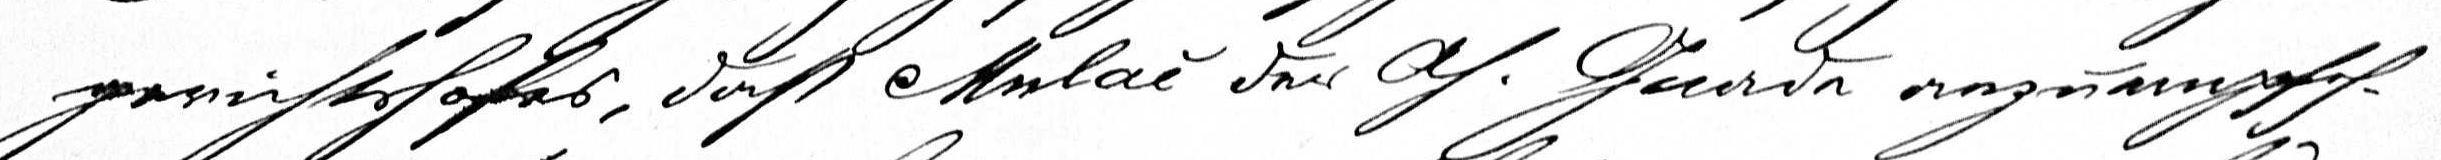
gerichtshofes, daß Mulač der Ah. Gnade anzuempfeh¬
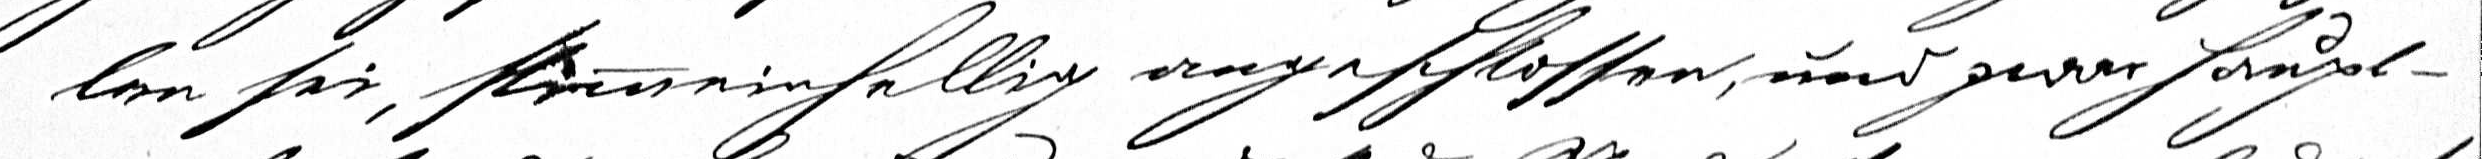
len sei, stimmeinhellig angeschlossen, und zwar Haupt¬
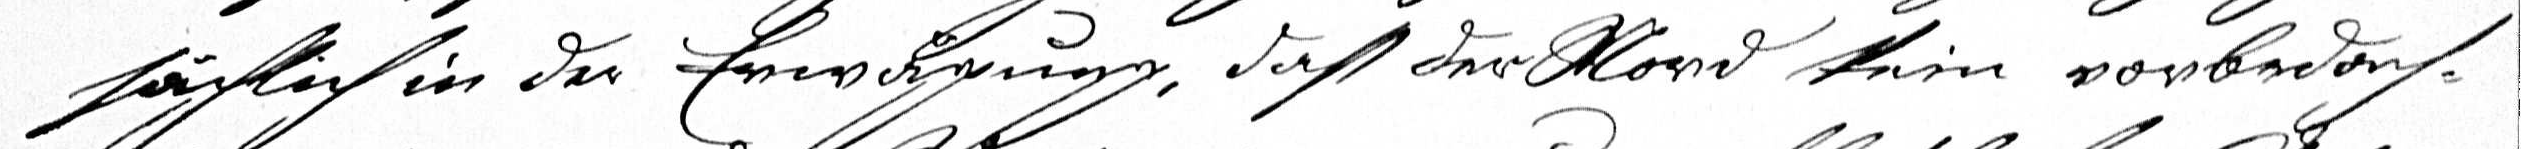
sächlich in der Erwägung, daß der Mord kein vorgedach¬
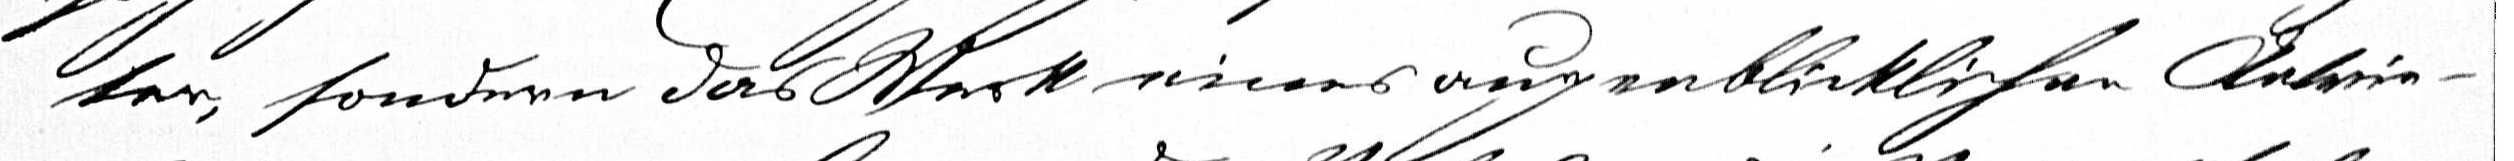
ter, sondern das Werk eines augenblicklichen Antrie¬
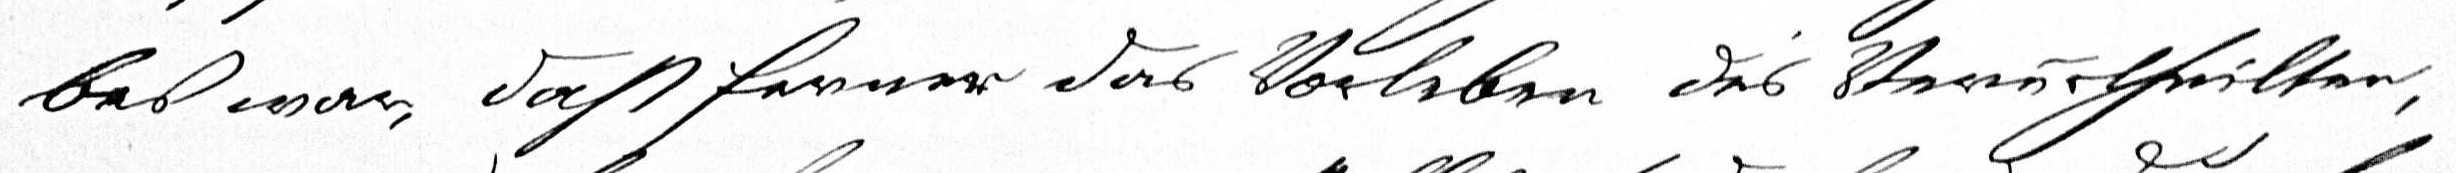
bes war, daß ferner das Vorleben das Verurtheilten,
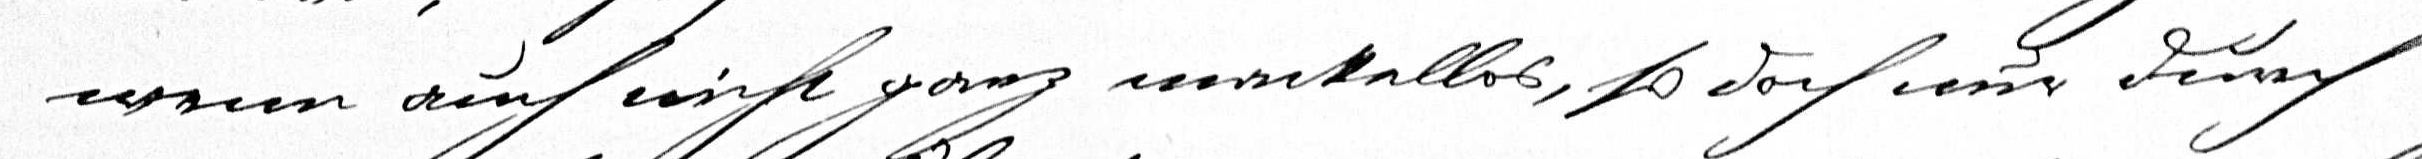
wenn auch nicht ganz mackellos, so doch nur durch
